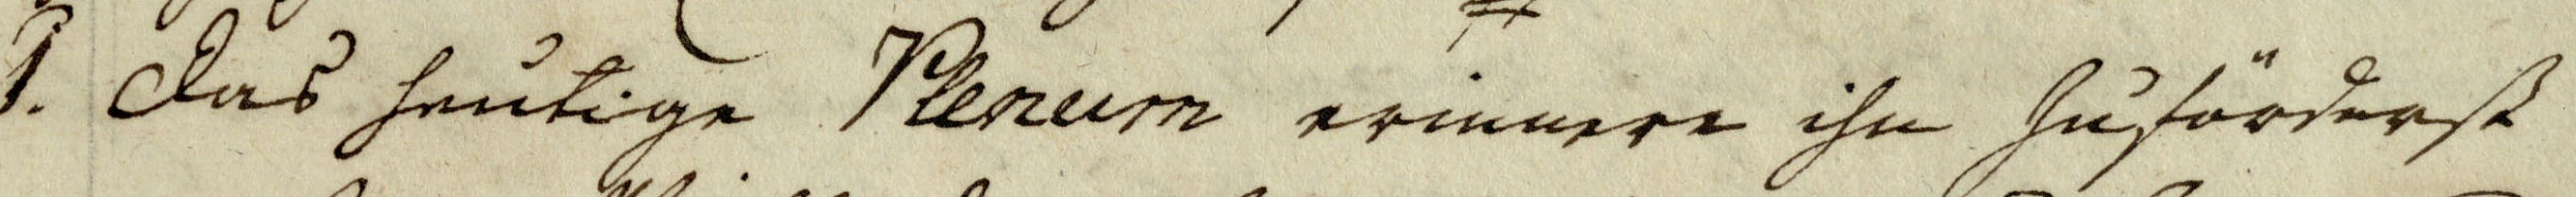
1. Das heutige Plenum erinnere ihn zuförderst
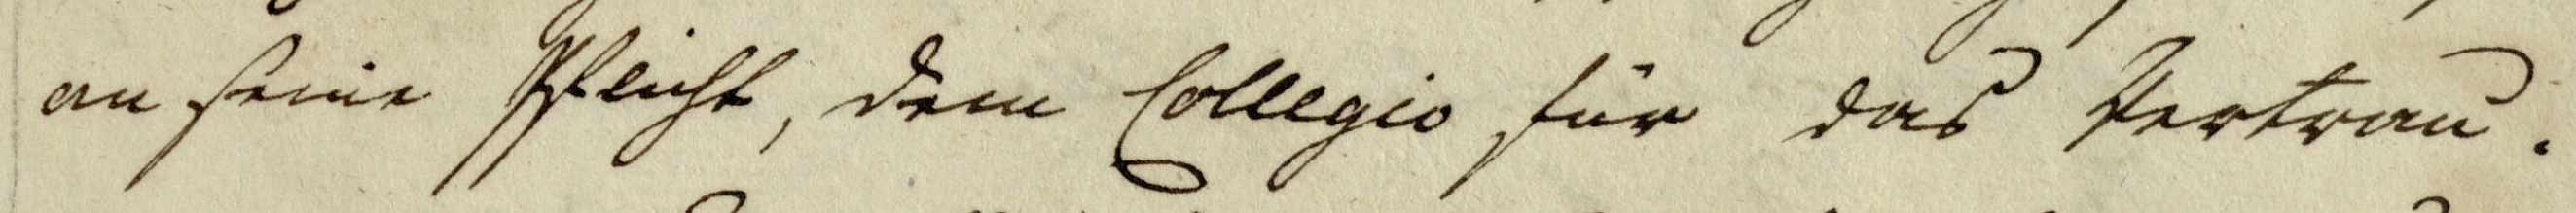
an seine Pflicht, dem Collegio für das Vertrau¬
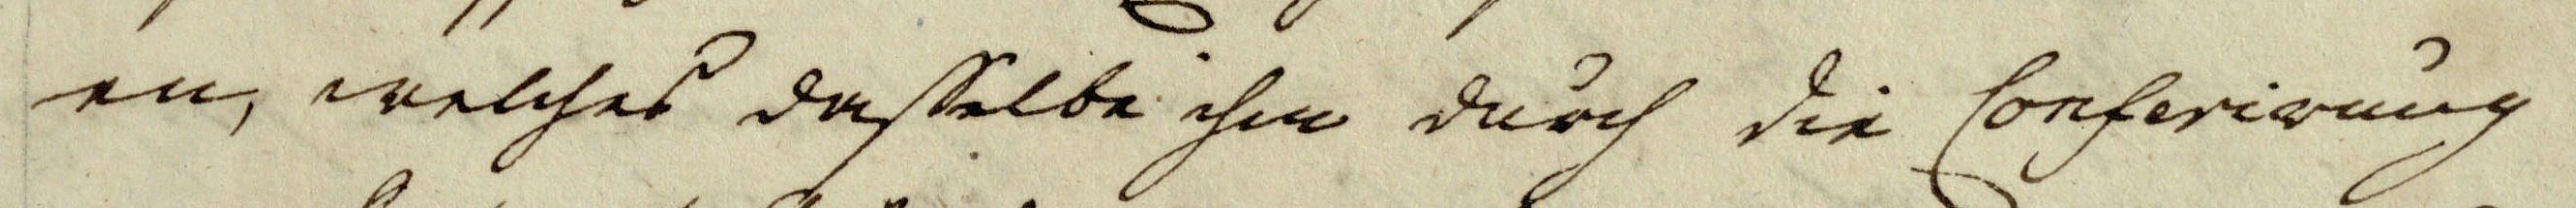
en, welches dasselbe ihm durch die Conferierung
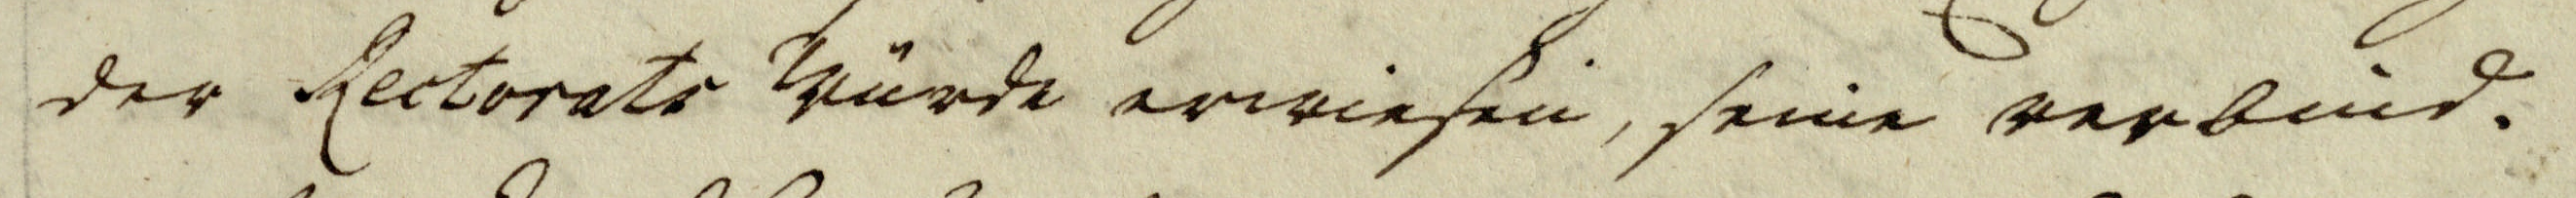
der Rectorats Würde erwiesen, seine verbind¬
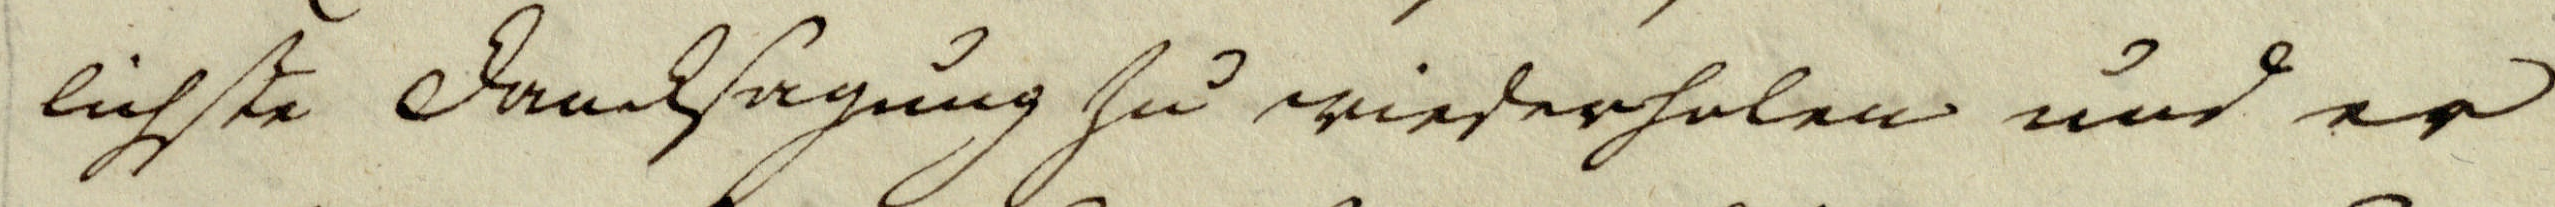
lichste Danksagung zu wiederholen und er
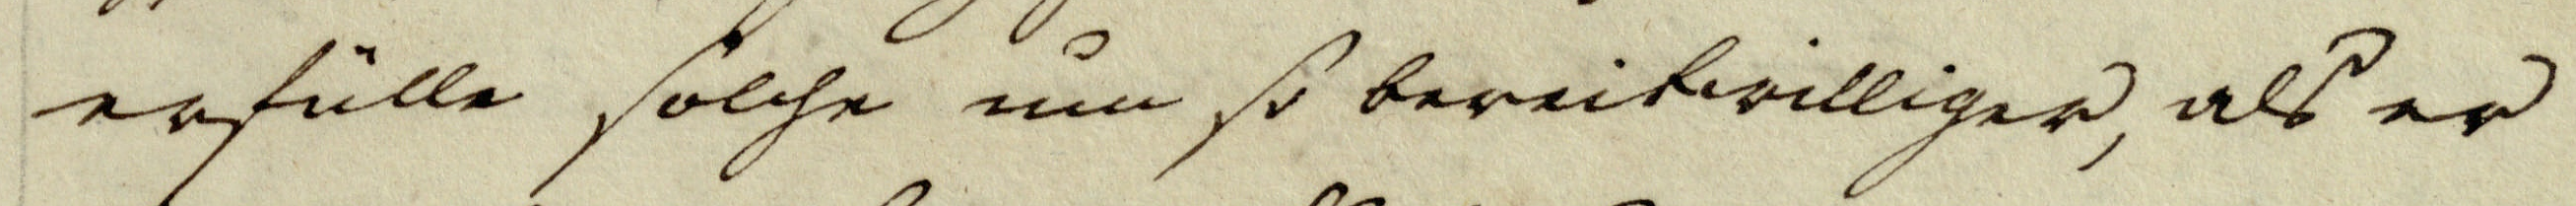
erfülle solche um so bereitwilliger, als er
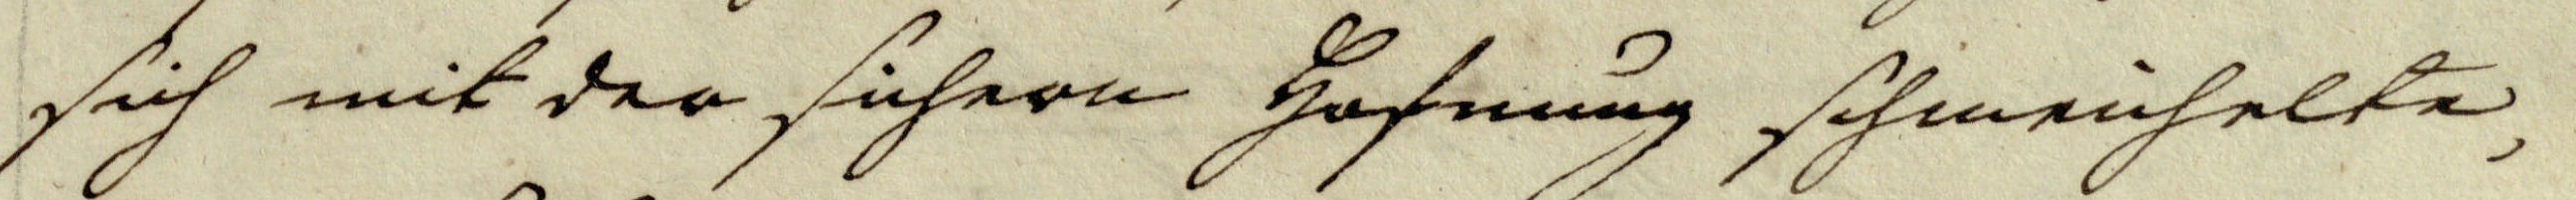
sich mit der sichern Hofnung schmeichelte,
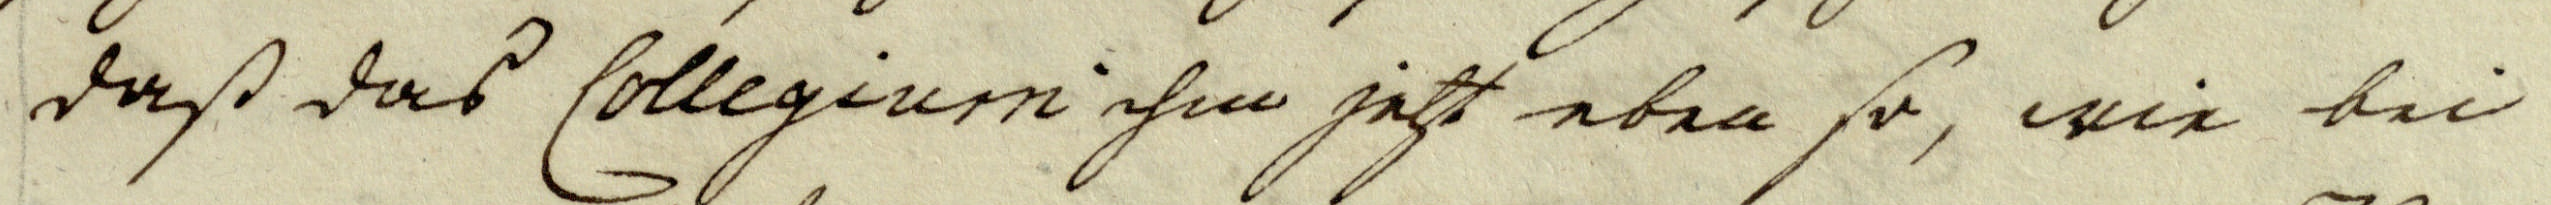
daß das Collegium ihm jetzt eben so, wie bei
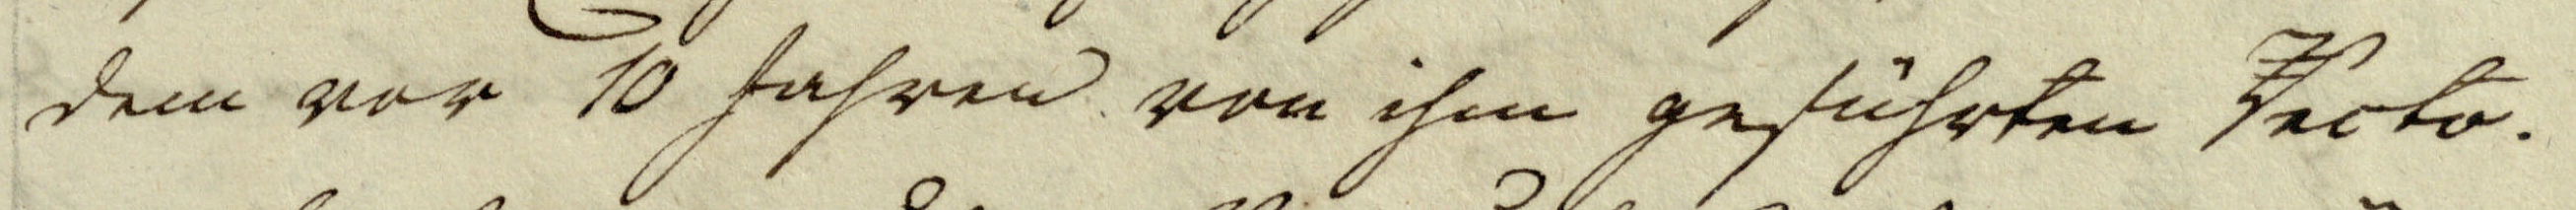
dem vor 10 Jahren von ihm geführten Recto¬
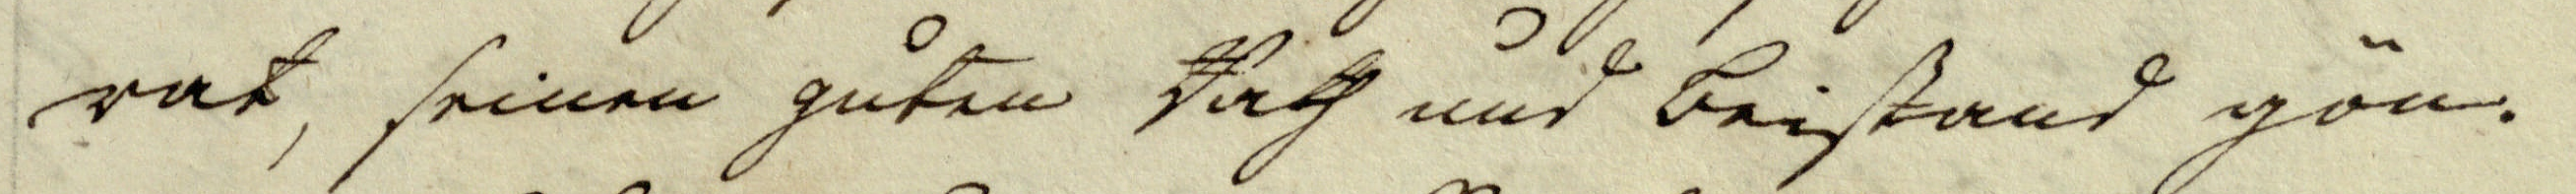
rat, seinen guten Rath und Beistand gön¬
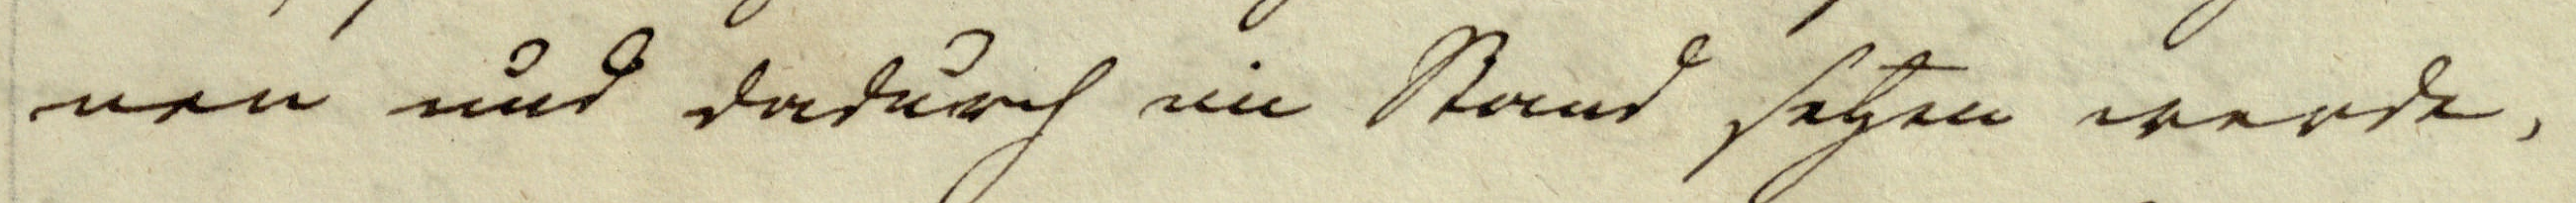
nen und dadurch in Stand setzen werde,
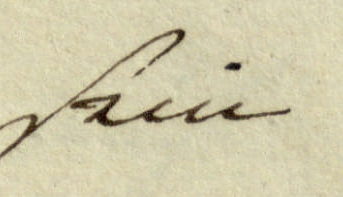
sein
